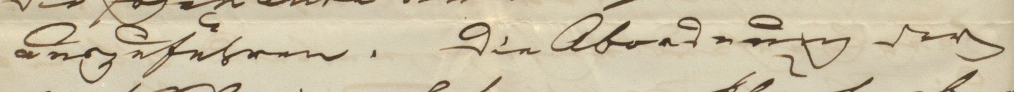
auszuführen. Die Abordnung der
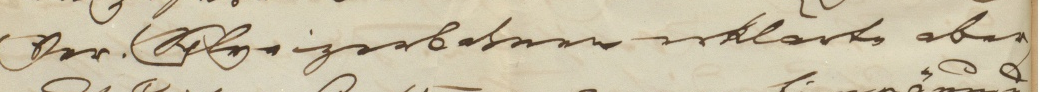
Ver. Schweizerbahnen erklärte aber,
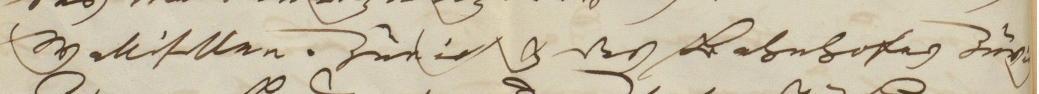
Wallisellen–Zürich & des Bahnhofes Zürich
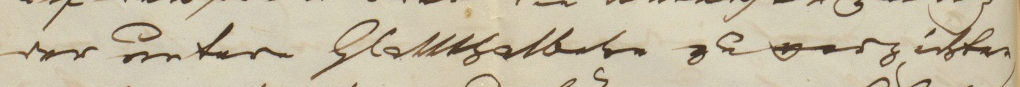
der untern Glattthalbahn zu verzichten,
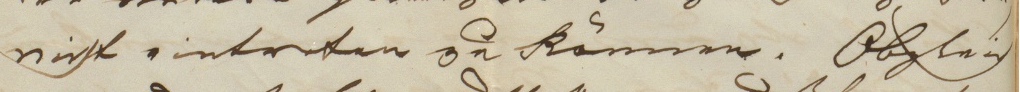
nicht eintreten zu können. Obgleich
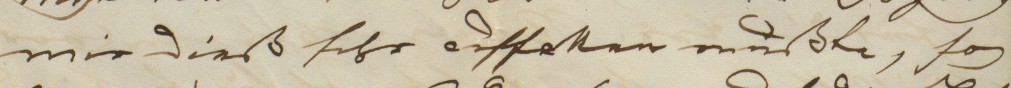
mir dieß sehr auffallen mußte, so
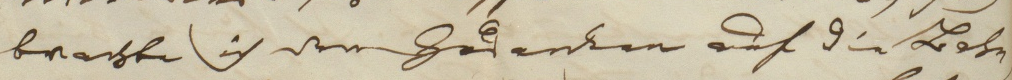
brachte ich den Gedanken auf die Bahn,
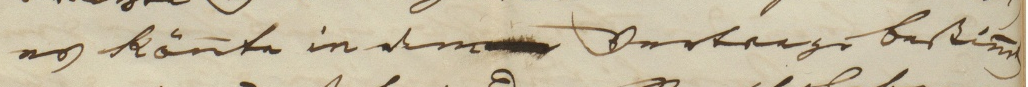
es könnte in dem Vertrage bestimmt
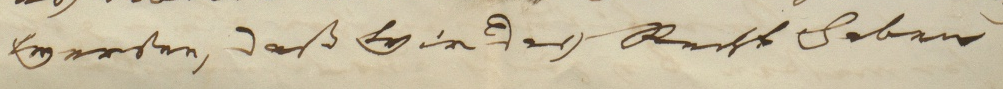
werden, daß wir das Recht haben
